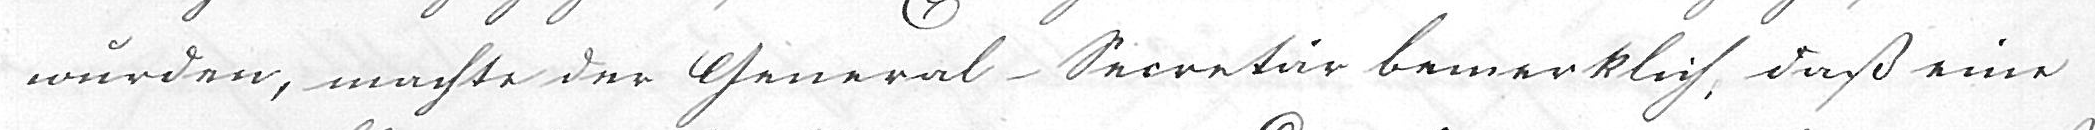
wurden, machte der General-Secretär bemerklich, daß eine
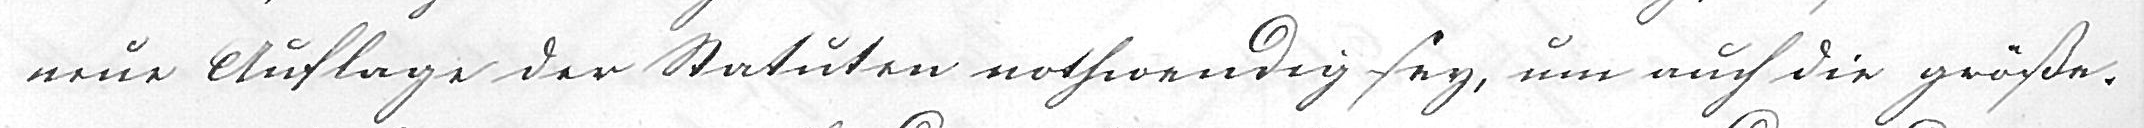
neue Auflage der Statuten nothwendig sey, um auch die größe-
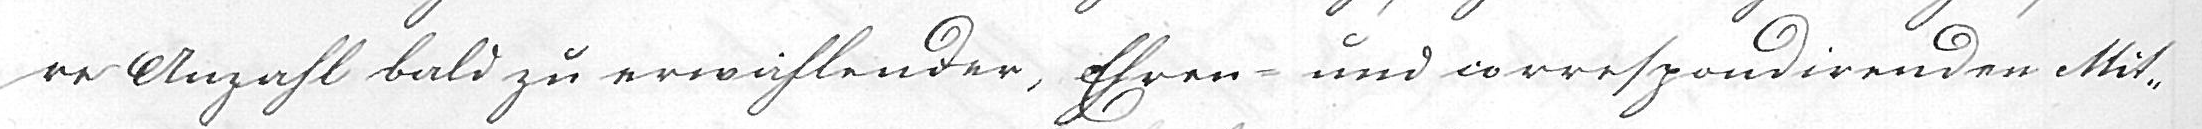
re Anzahl bald zu erwählender, Ehren- und correspondirenden Mit-
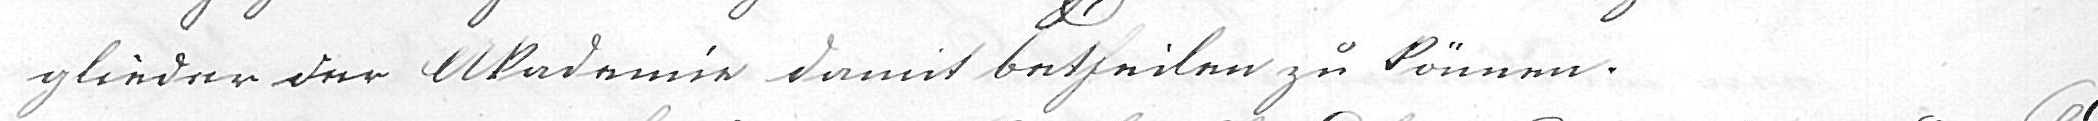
glieder der Akademie damit betheilen zu können.
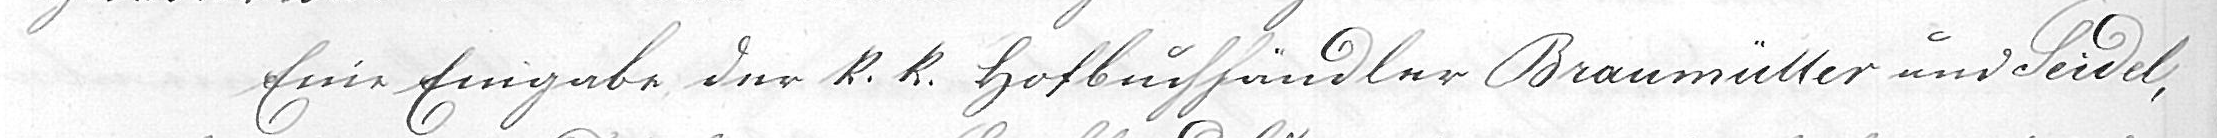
Eine Eingabe der k.k. Hofbuchhändler Braumüller und Seidel,
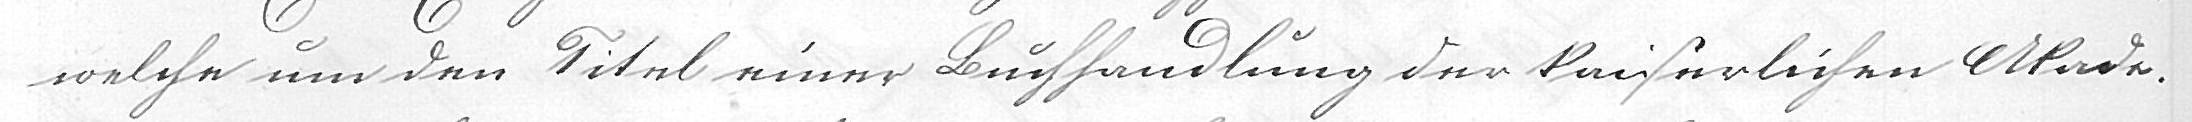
welche m den Titel einer Buchhandlung der Kaiserlichen Akade-
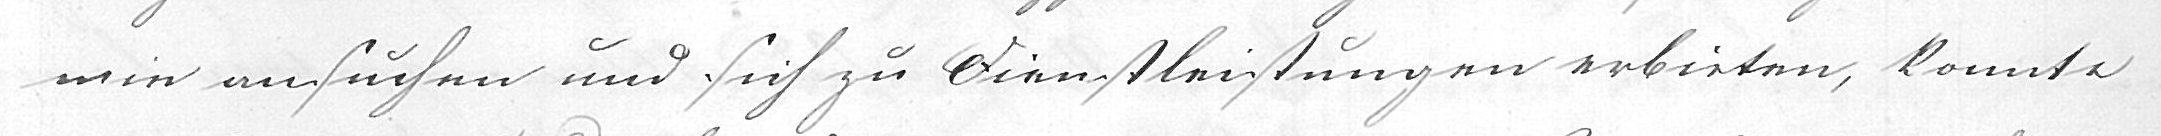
mie ansuchen und sich zu Dienstleistungen erbieten, konnte
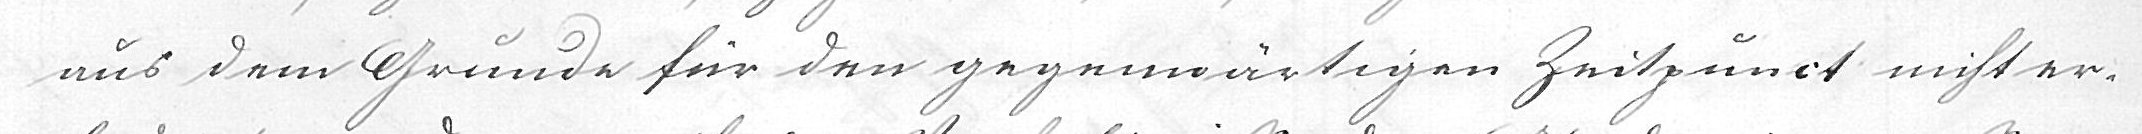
aus dem Grunde für den gegenwärtigen Zeitpunct nicht er-
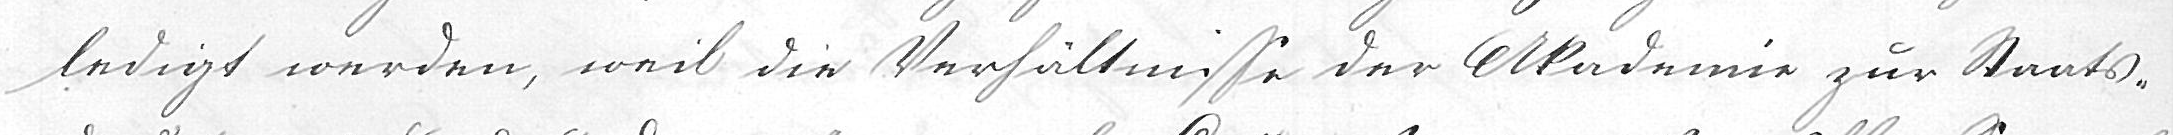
ledigt werden, weil die Verhältnisse der Akademie zur Staats-
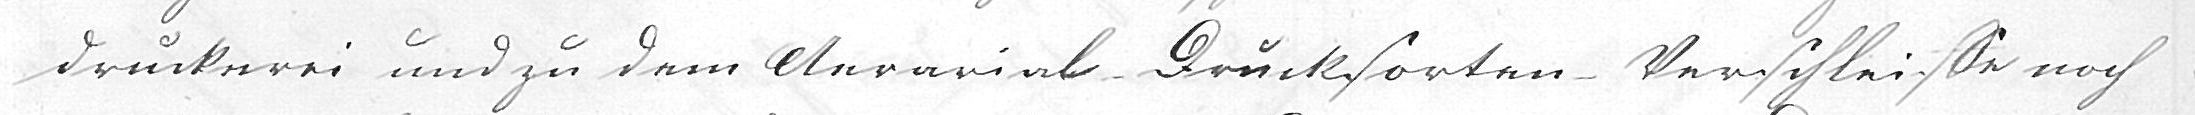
druckerei und zu dem Aerarial-Drucksorten-Verschleisse noch
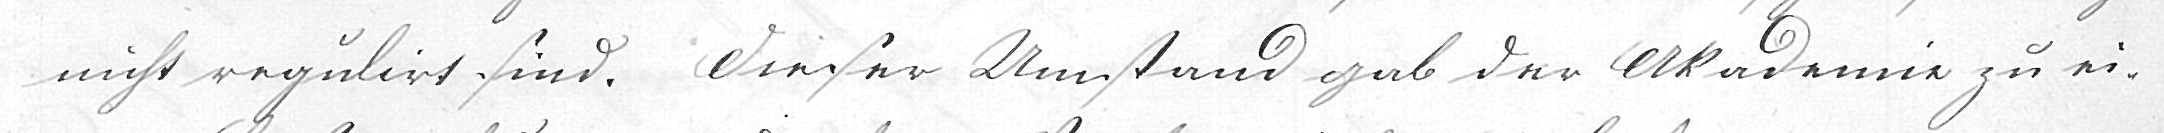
nicht regulirt sind. Dieser Umstand gab der Akademie zu ei-
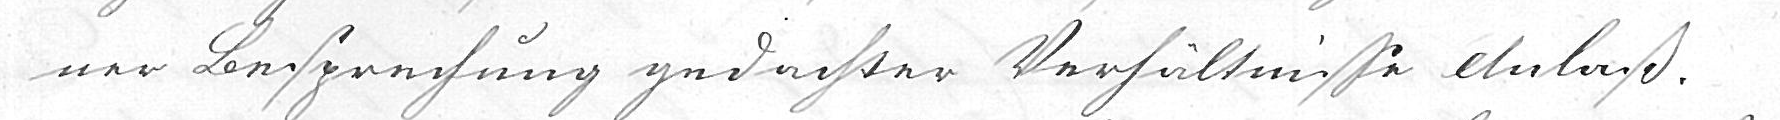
ner Besprechung gedachter Verhältnisse Anlaß.
